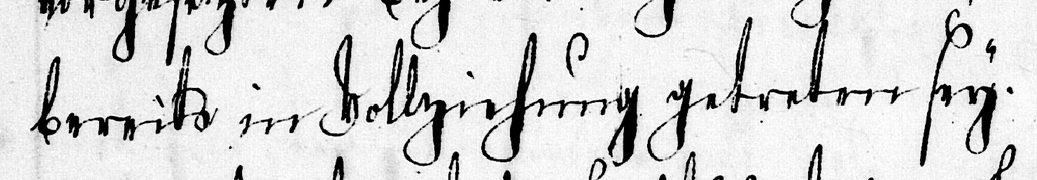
bereits in Vollziehung getreten sey.
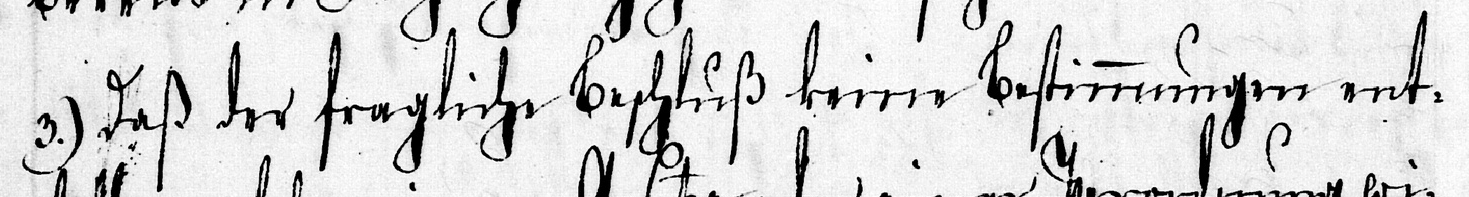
3.) Daß der fragliche Beschluß keine Bestimmungen ent¬
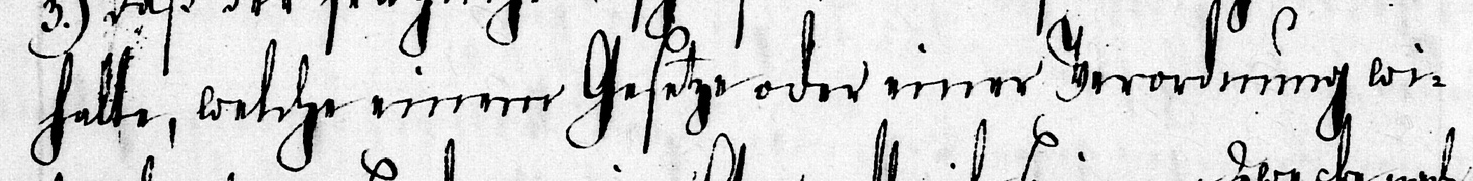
halte, welche einem Gesetze oder einer Verordnung wi¬
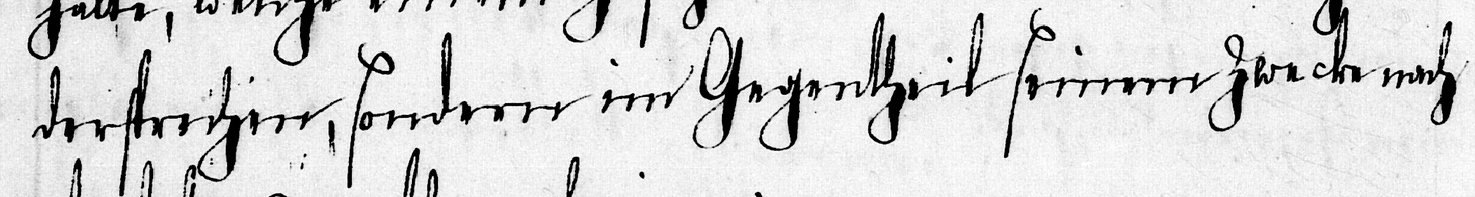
dersprechen, sondern im Gegentheil seinem Zwecke nach
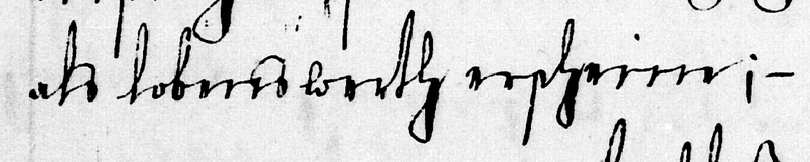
als lobenswerth erscheinen;
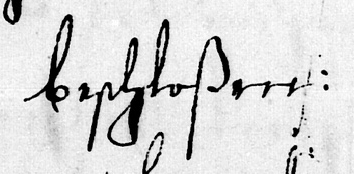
beschloßen:
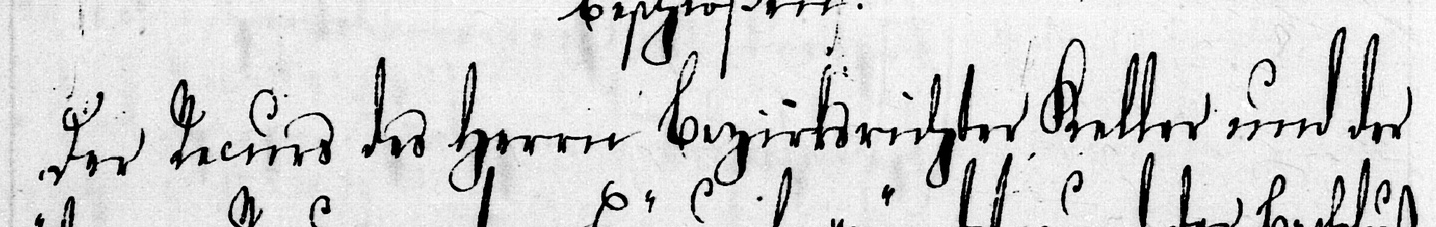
Der Recurs des Herrn Bezirksrichter Keller und der
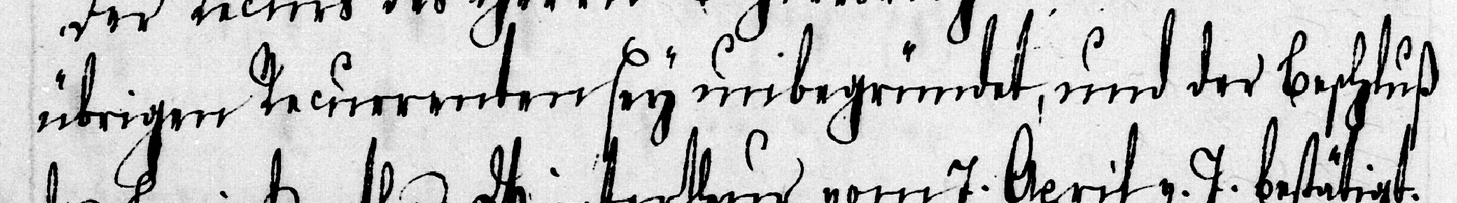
übrigen Recurrenten sey unbegründet, und der Beschluß
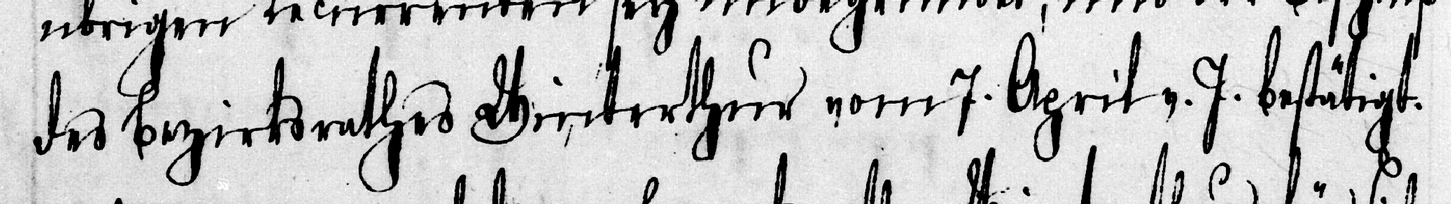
des Bezirksrathes Winterthur vom 7. April v. J. bestätigt.
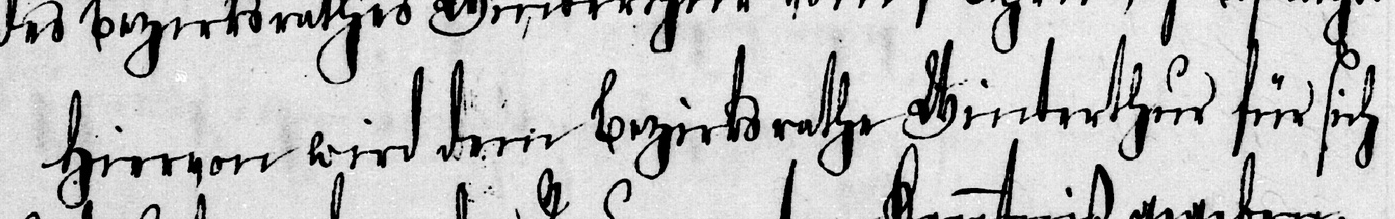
Hiervon wird dem Bezirksrathe Winterthur für sich
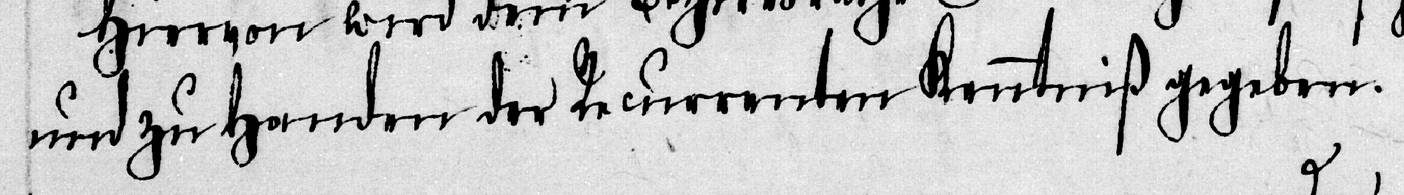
und zu Handen der Recurrenten Kenntniß gegeben.
